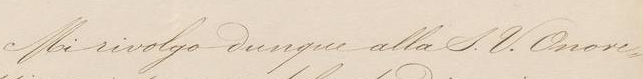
Mi rivolgo dunque alla S. V. Onore-
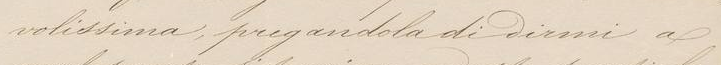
volissima, pregandola di dirmi a
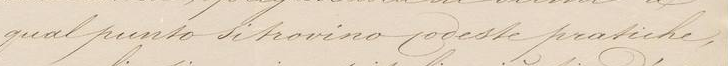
qual punto si trovino codeste pratiche,
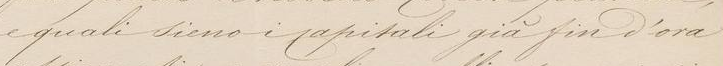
e quali sieno i capitali già fin d'ora
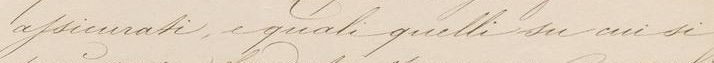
assicurati, e quali quelli su cui si
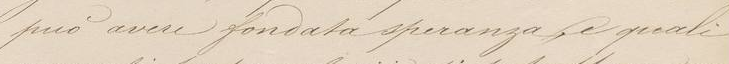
può avere fondata speranza, e quali
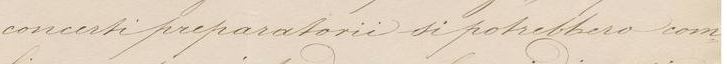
concerti preparatorii si potrebbero com-
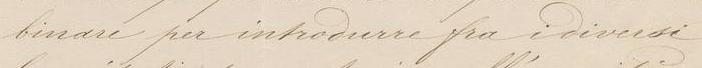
binare per introdurre fra i diversi
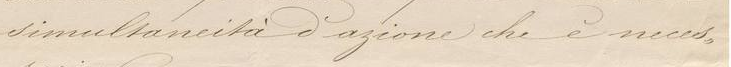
simultaneità d'azione che è neces-
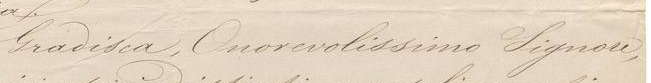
Gradisca, Onorevolissimo Signore,
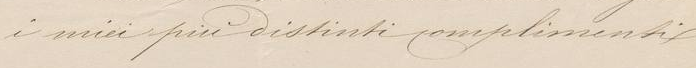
i miei più distinti complimenti
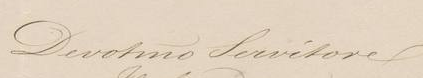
Devotissimo Servitore
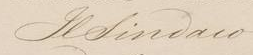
Il Sindaco
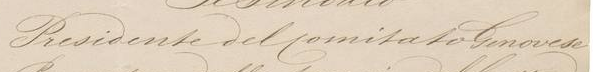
Presidente del comitato Genovese
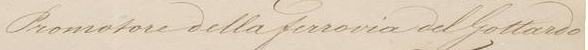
Promotore della ferrovia del Gottardo
